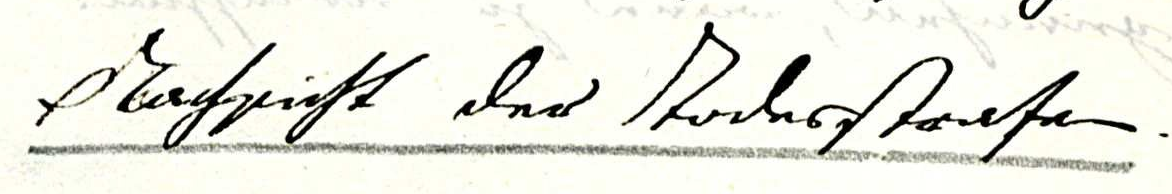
Nachsicht der Todesstrafe.
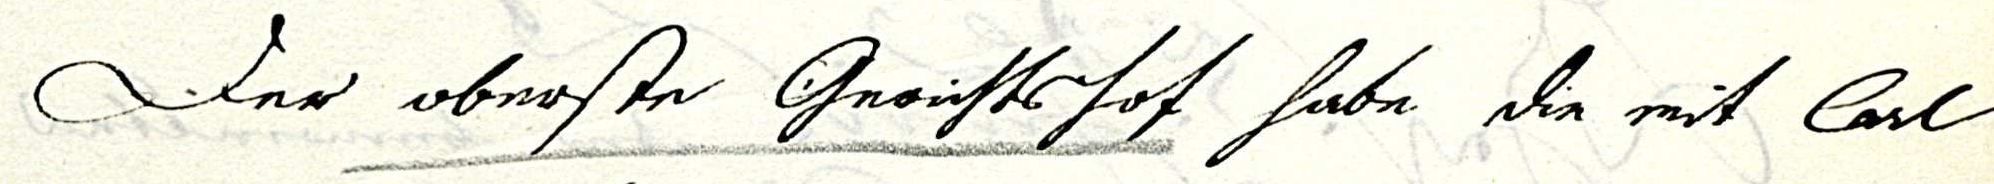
Der oberste Gerichtshof habe die mit Carl
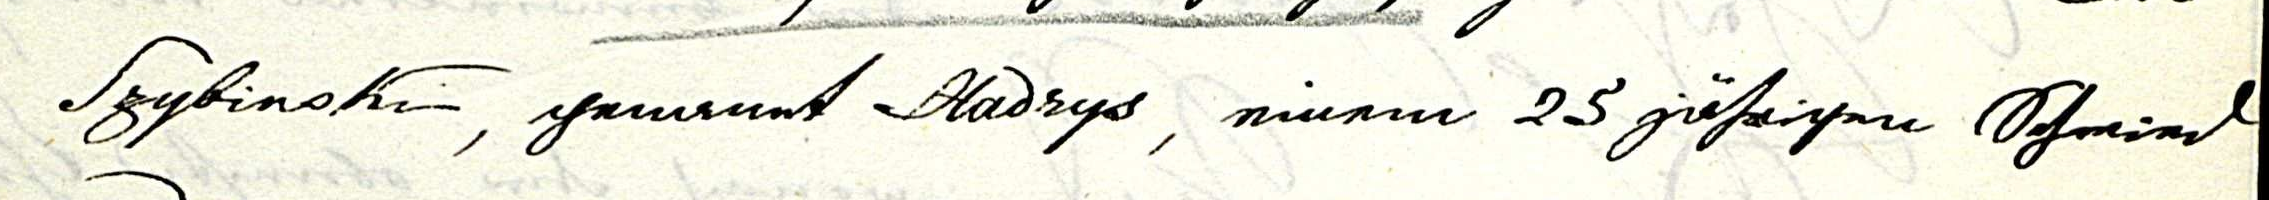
Szybinski, genannt Hadrys, einem 25jährigen Schmied
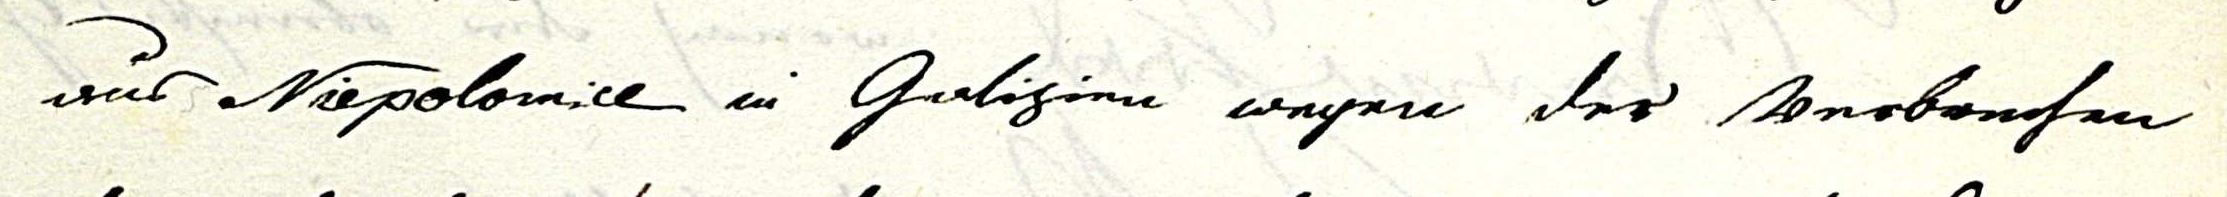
aus Niepolomice [Niepołomice] in Galizien wegen des Verbrechen
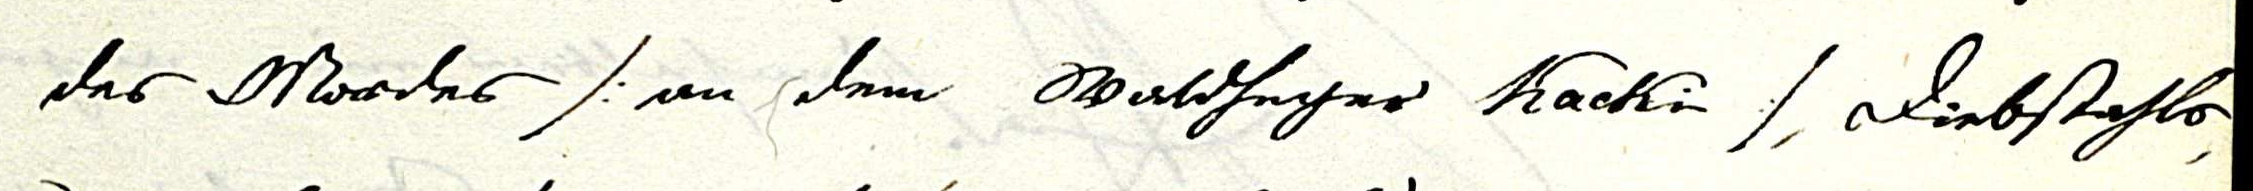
des Mordes (an dem Waldheger Kackin), Diebstahls,
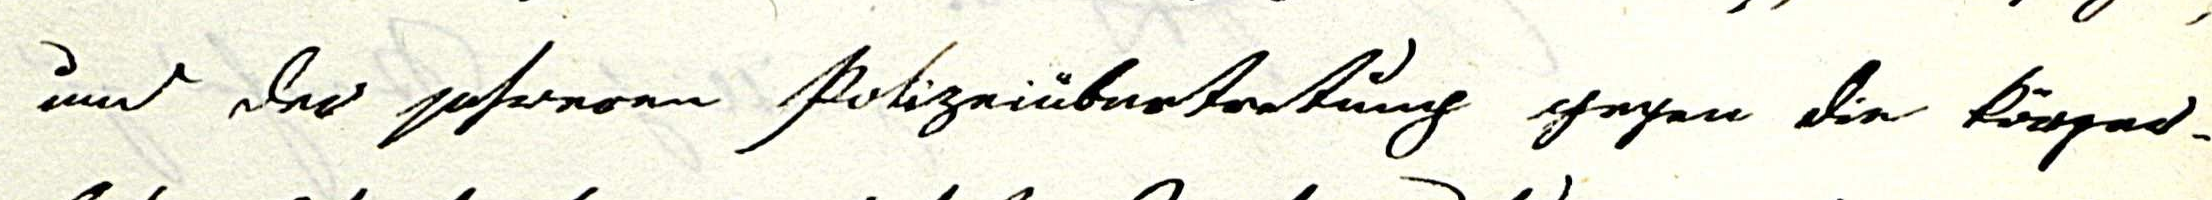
und der schweren Polizeiübertretung gegen die körper¬
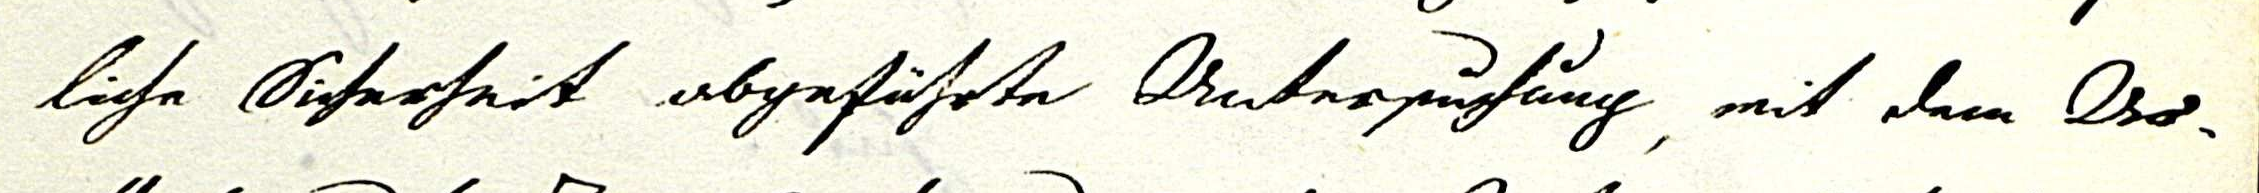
liche Sicherheit abgeführte Untersuchung, mit dem Ur¬
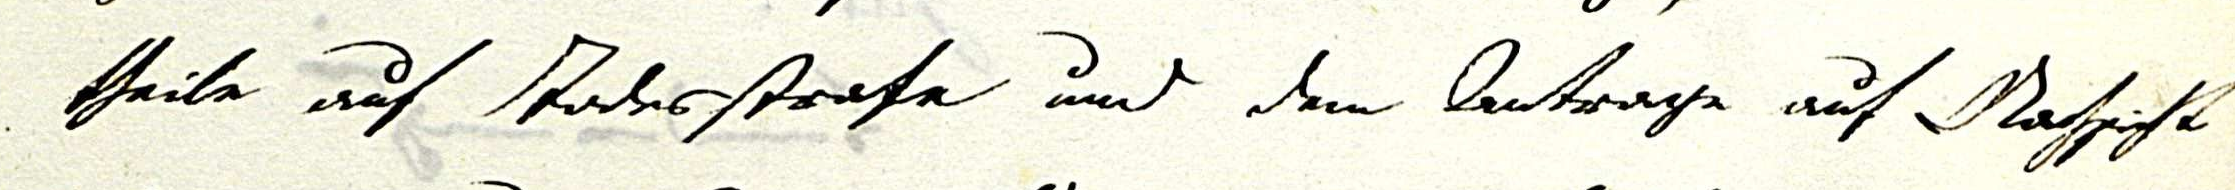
theile auf Todesstrafe und dem Antrage auf Nachsicht
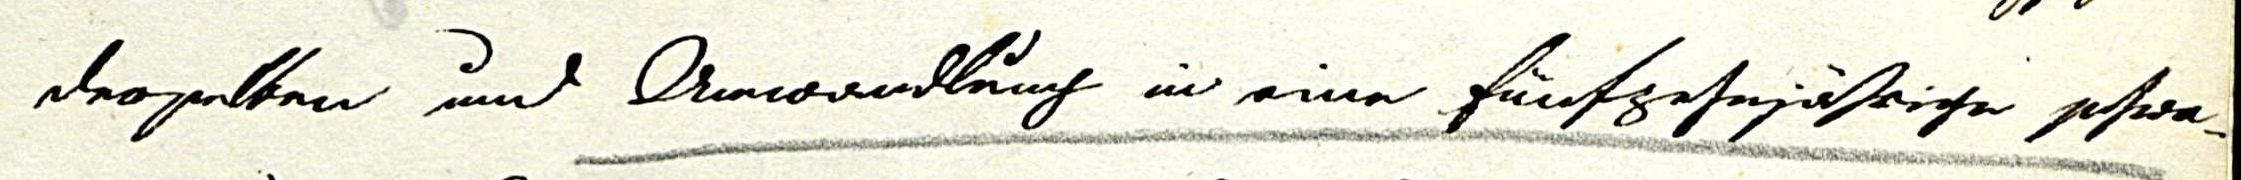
derselben und Umwandlung in eine fünfzehnjährige schwe¬
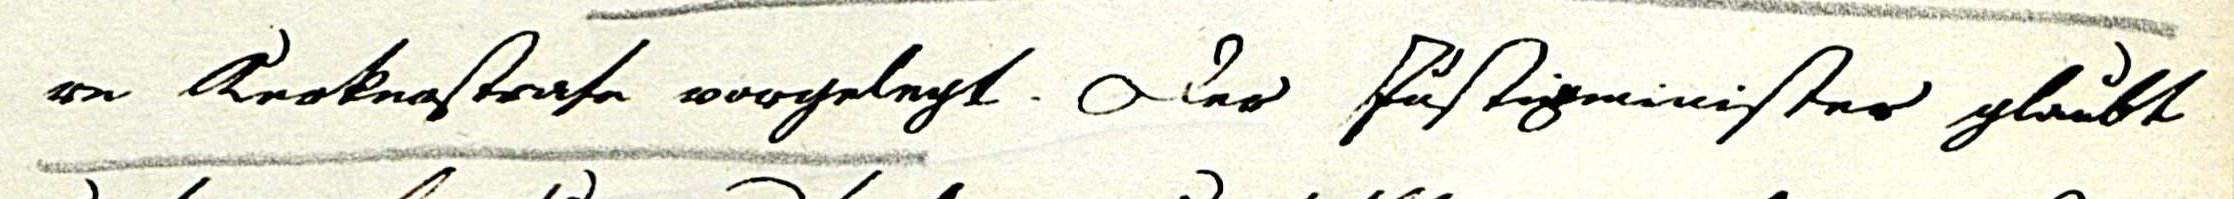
re Kerkerstrafe vorgelegt. Der Justizminister glaubt
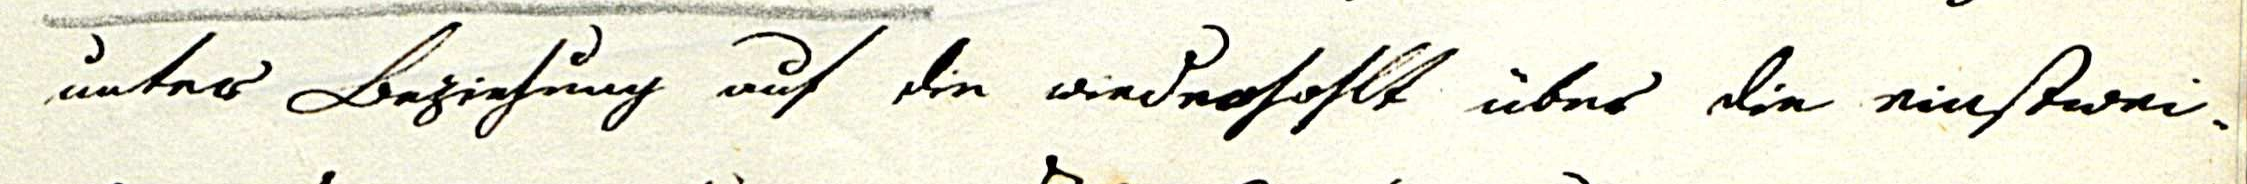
unter Beziehung auf die wiederhohlt über die einstwei¬
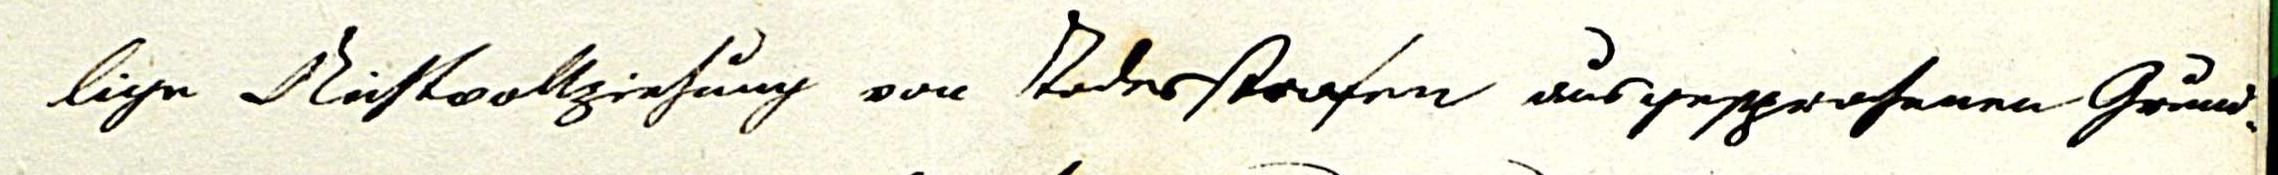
lige Nichtvollziehung von Todesstrafen ausgesprochene Grund¬
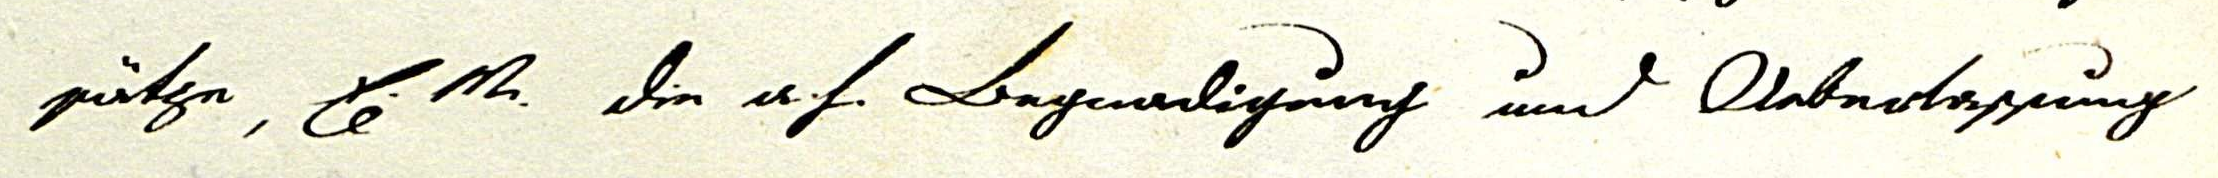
sätze, E.M. die a.h. Begnadigung und Ueberlassung
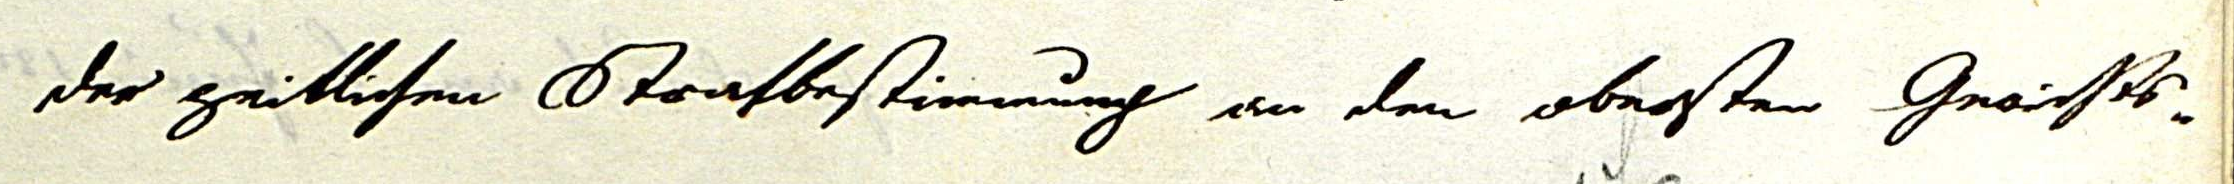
der zeitlichen Strafbestimmung an den obersten Gerichts¬
